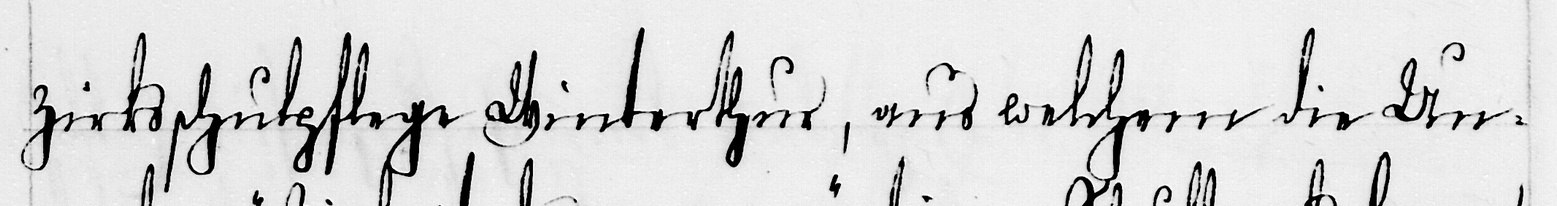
zirksschulpflege Winterthur, aus welchem die Un¬
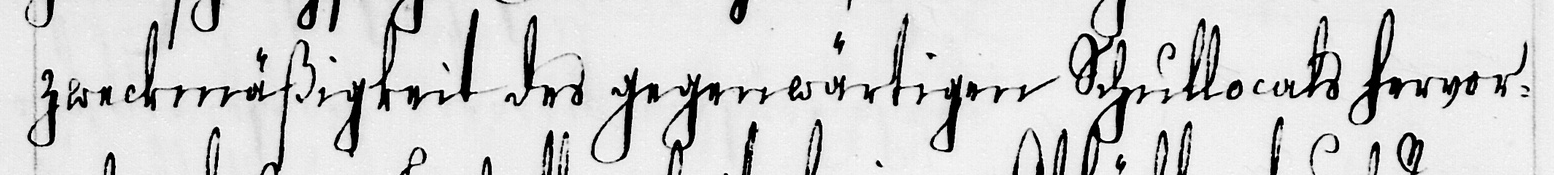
zweckmäßigkeit des gegenwärtigen Schullocals hervor¬
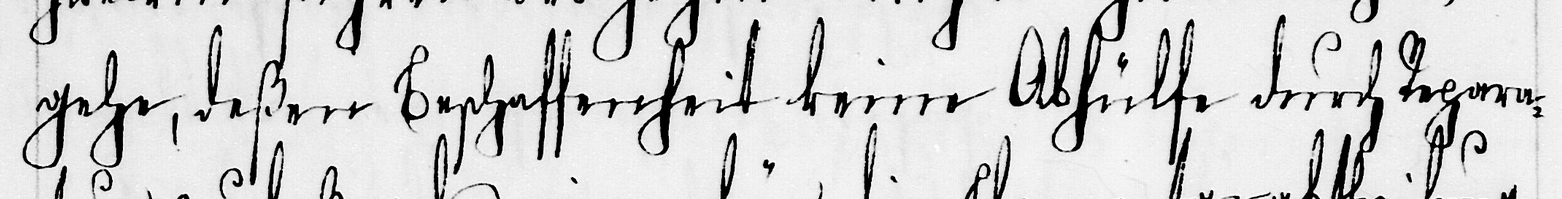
gehe, deßen Beschaffenheit keine Abhülfe durch Repar¬
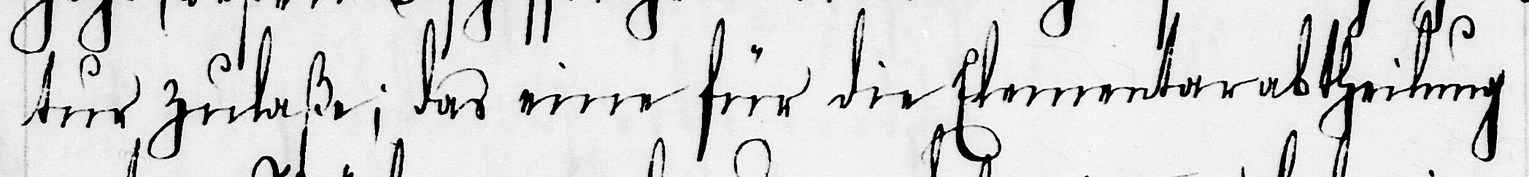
atur zulaße; das eine für die Elementarabtheilung
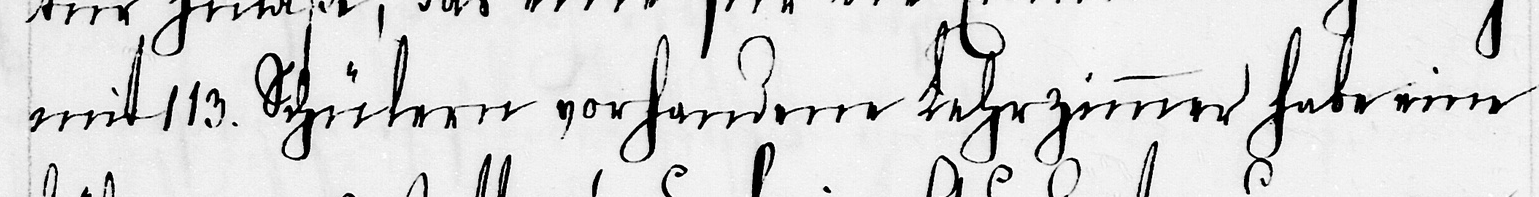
mit 113. Schülern vorhandene Lehrzimmer habe eine
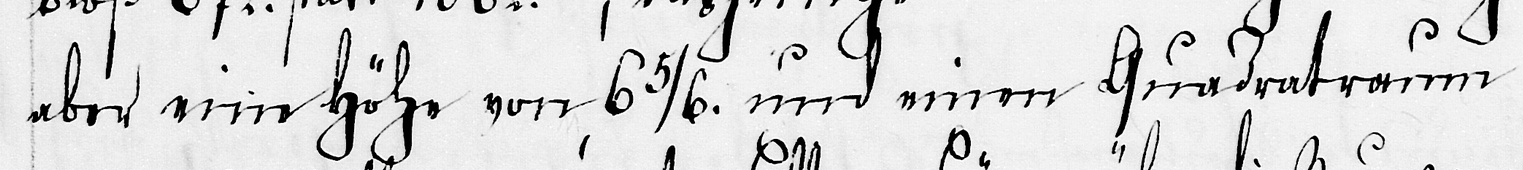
aber eine Höhe von 6 5/6. und einen Quadratraum
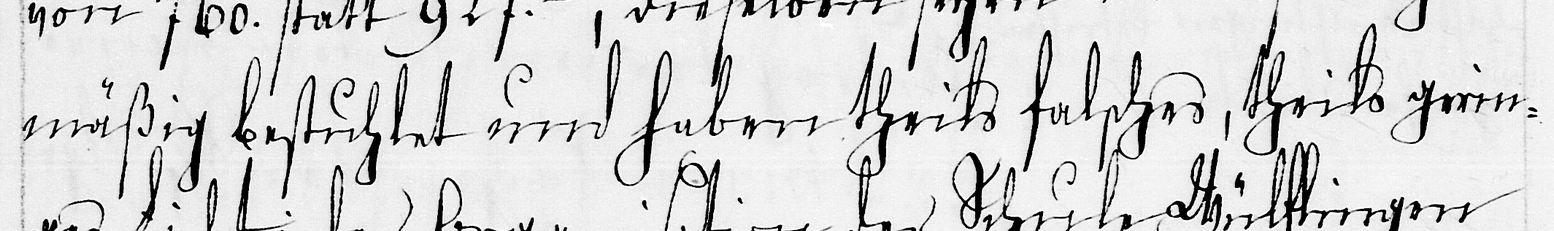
mäßig bestuhlet und haben theils falsches, theils geri¬
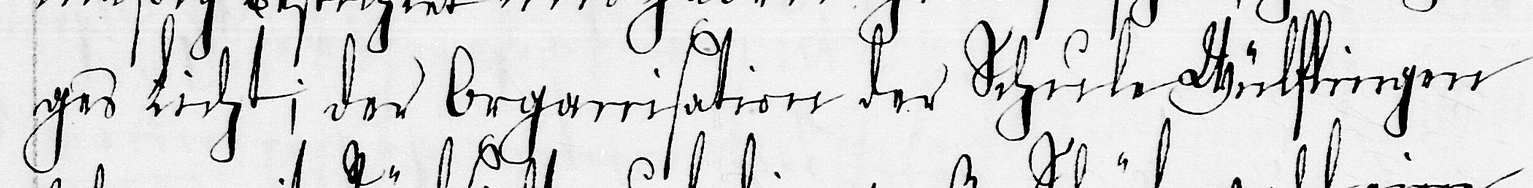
nges Licht; der Organisation der Schule Wülflingen
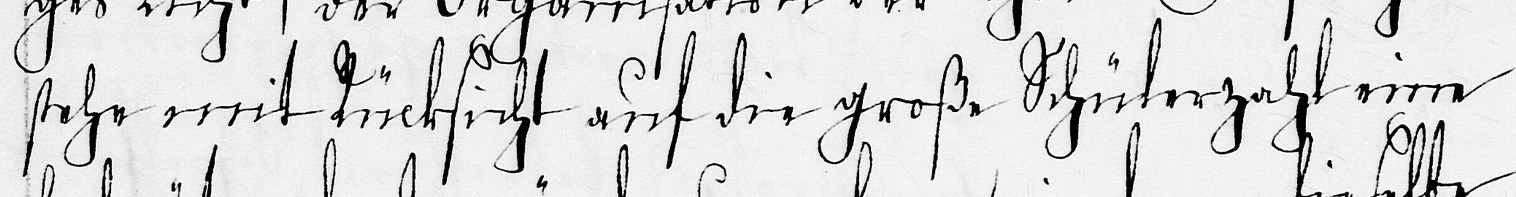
stehe mit Rücksicht auf die große Schülerzahl eine
